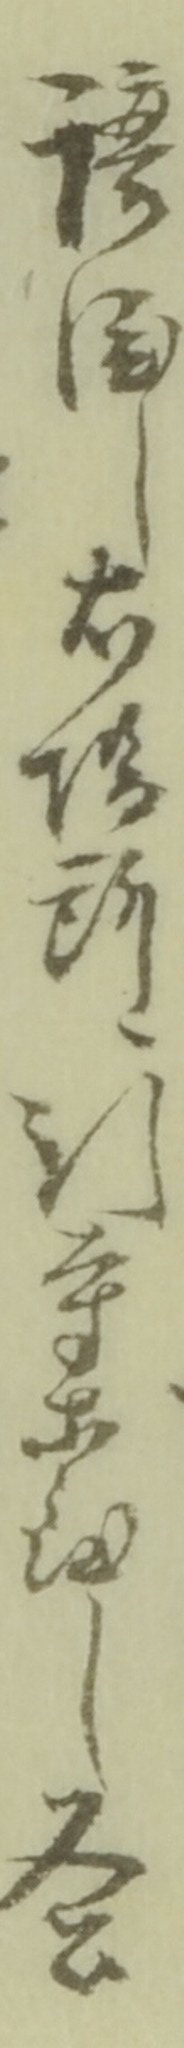譲渡候右場所へ引寺等致候又者
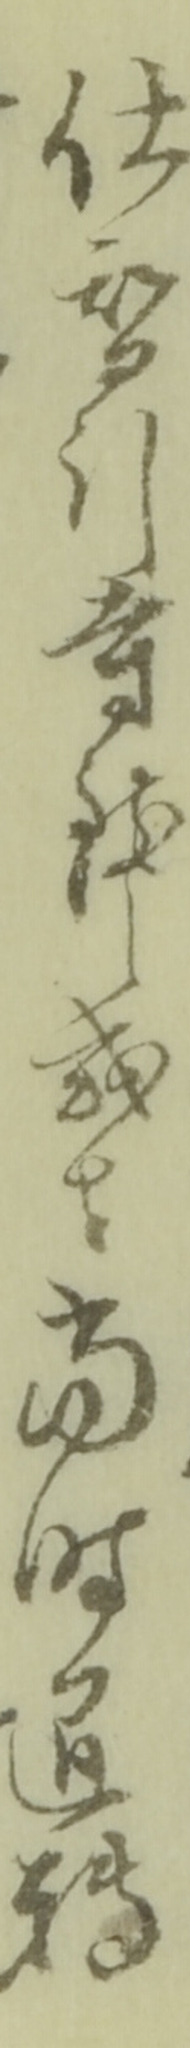仕替引寺致候或者当時通轉
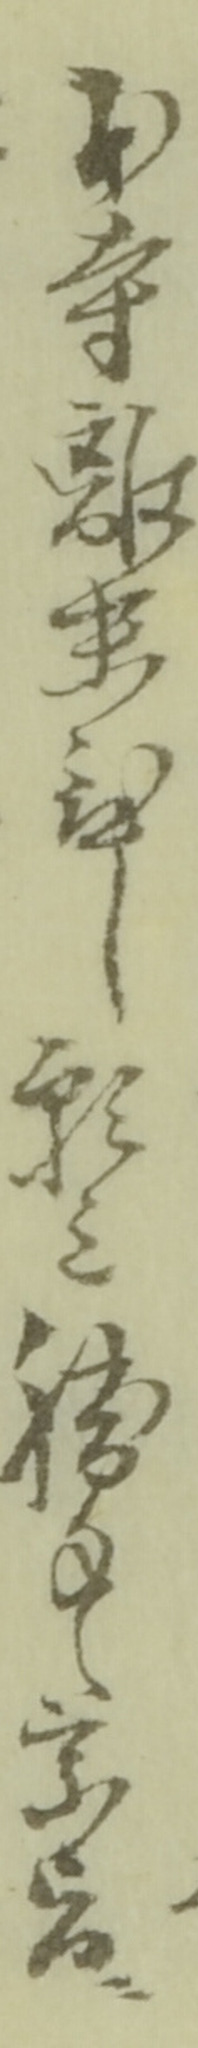本寺離末致候願迄勝手之宗旨二
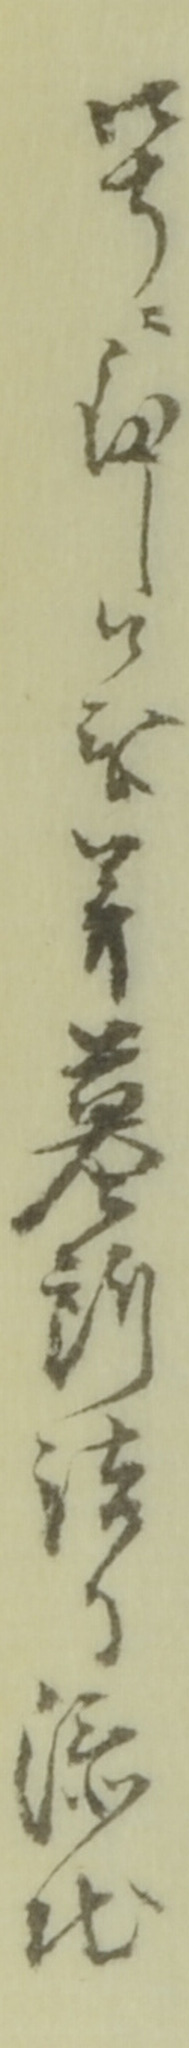等二致候義並墓所詰り添地
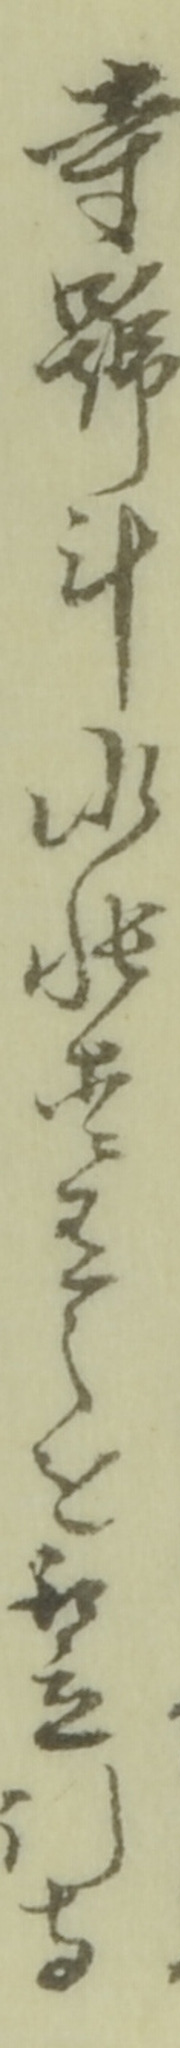寺號計水帳等有之候を取立引寺

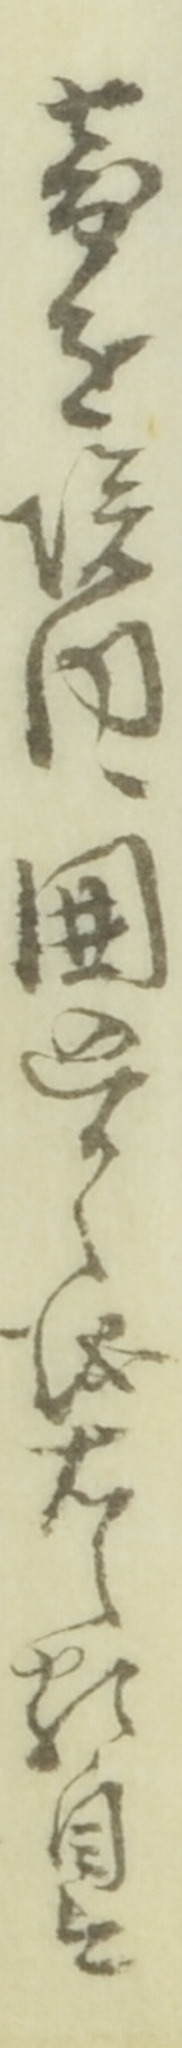面を境内へ囲込候儀右之類自今
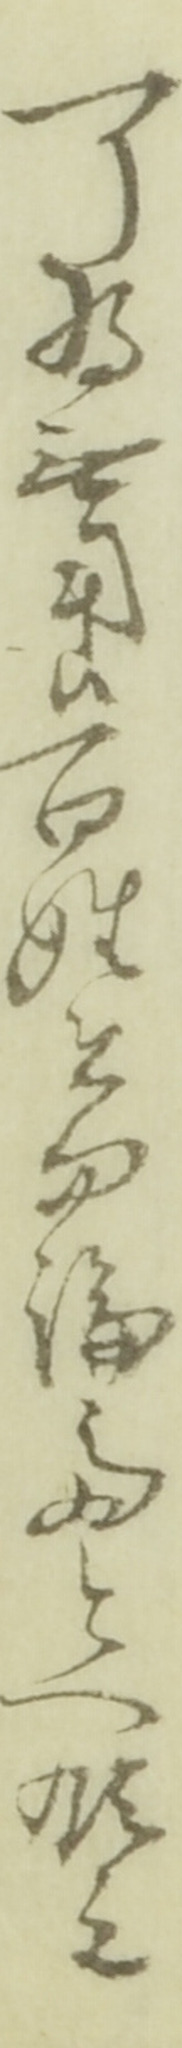可為無用候百姓者勿論たとへ領之
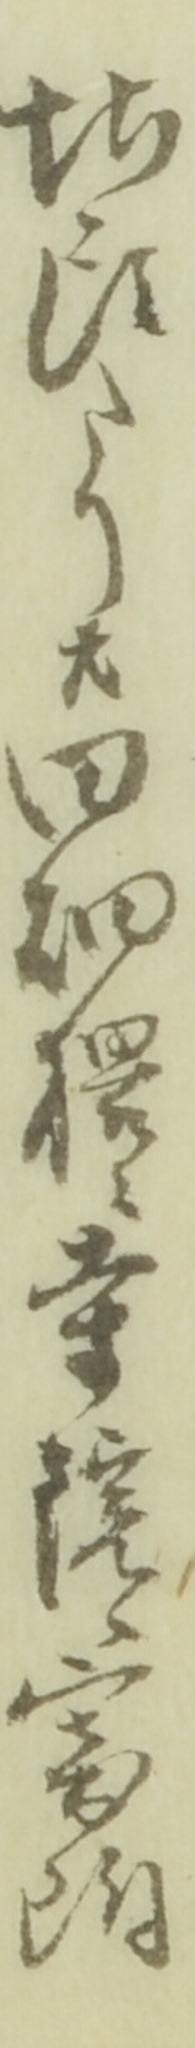地頭たり共田畑猥二寺院へ寄附
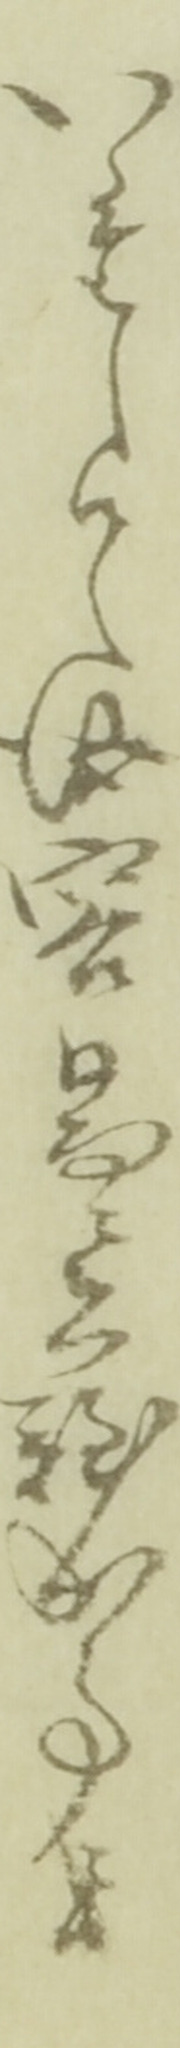いたし候之儀容易二者難成事二候
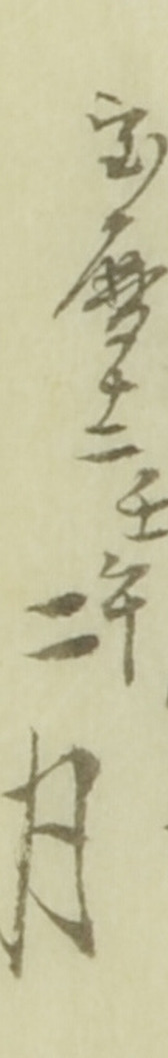宝暦十二壬午二月
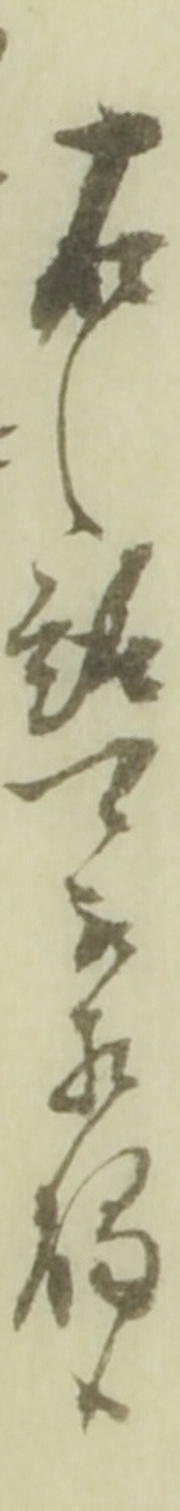右之趣可被相触候
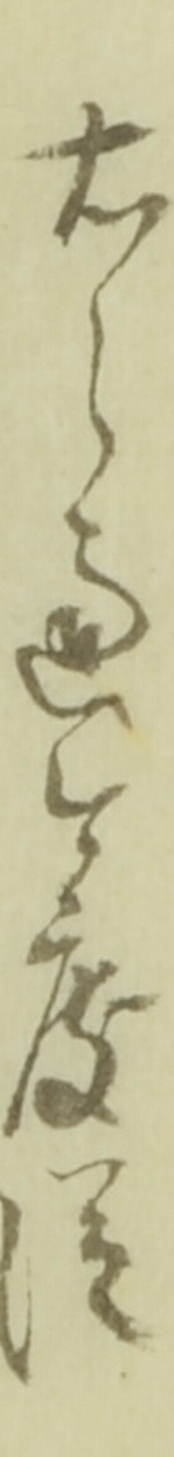右之通今度従
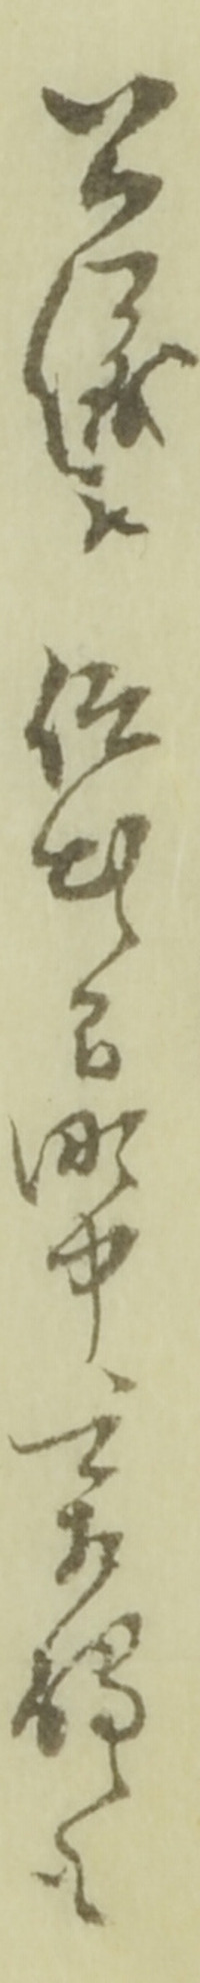公儀被仰出候間町中へ可相触候以上
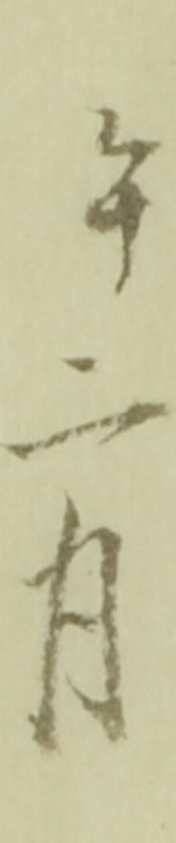午二月
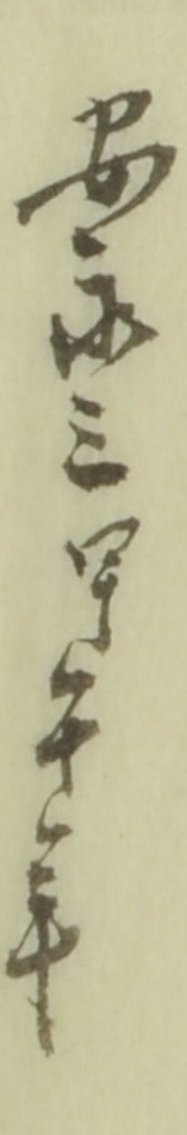安永三年申午年
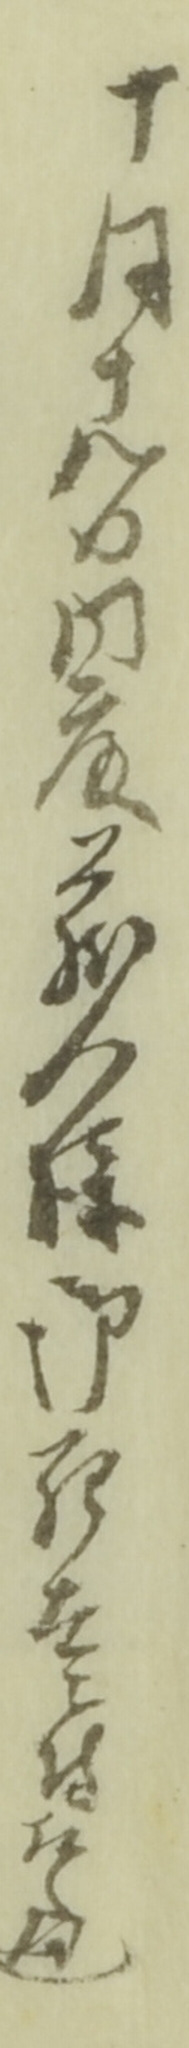十月十八日内藤蔵様御逝去二付左之通
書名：御公儀様御領主様御触書控
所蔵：伊那市立高遠町図書館・合同会社AMANE
